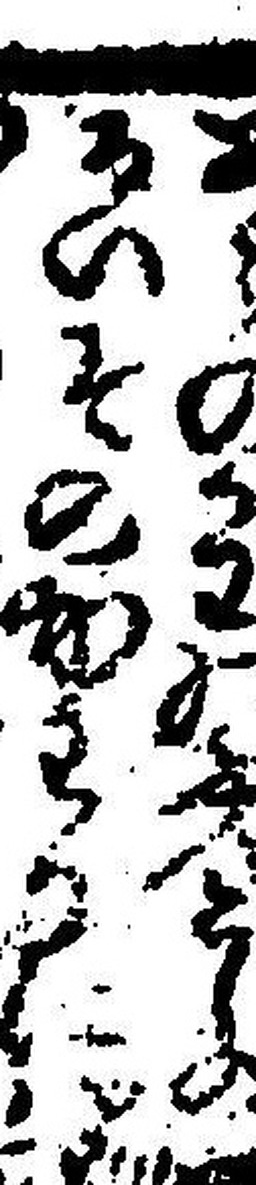るいそのかわりに
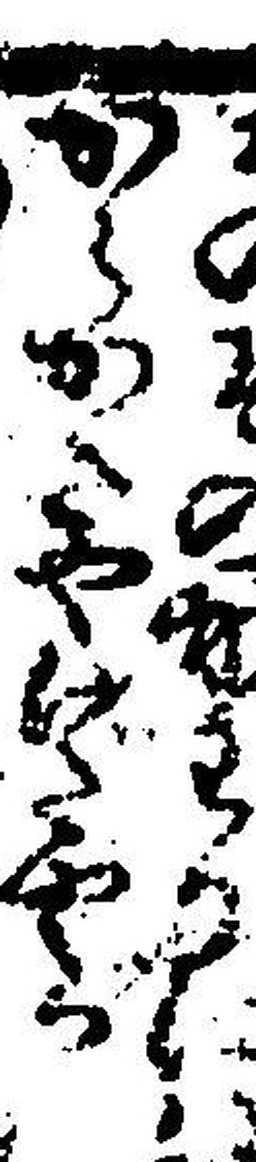からかさやげたやが
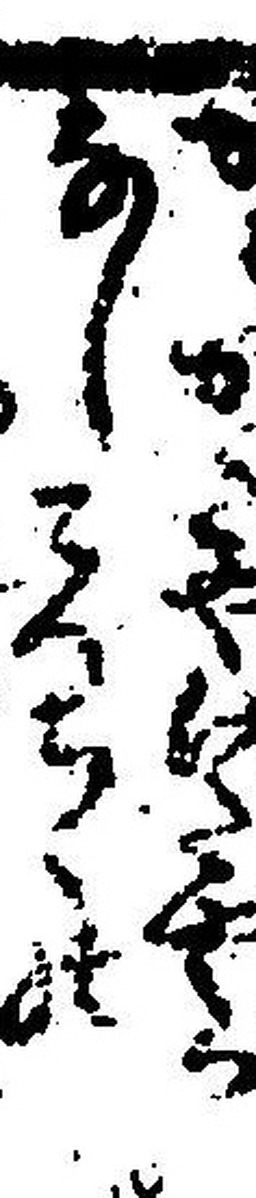なしてんちくの
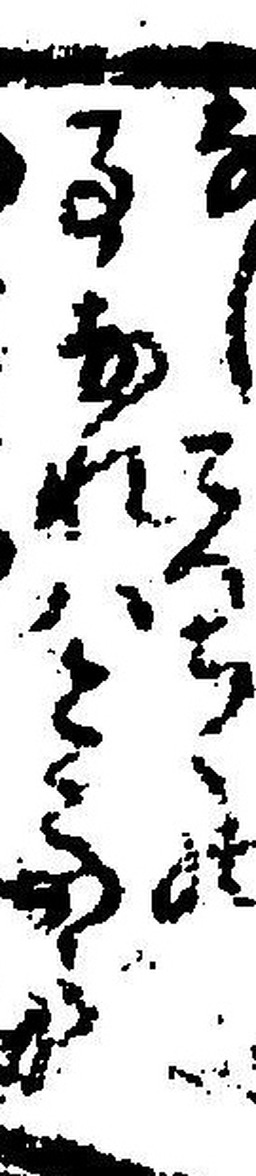事なれはとこからか
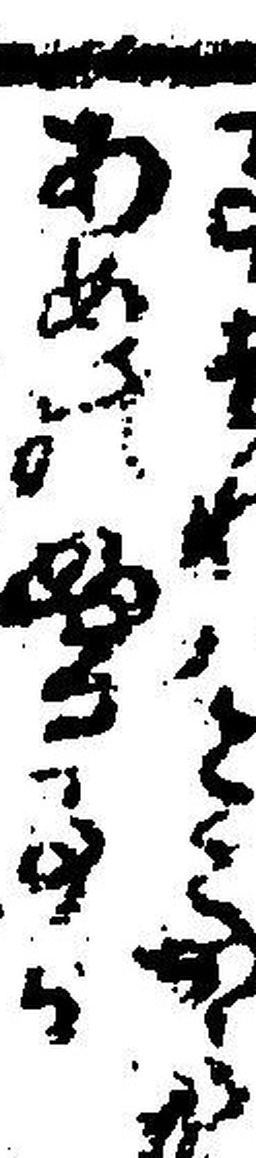あめのふる事か
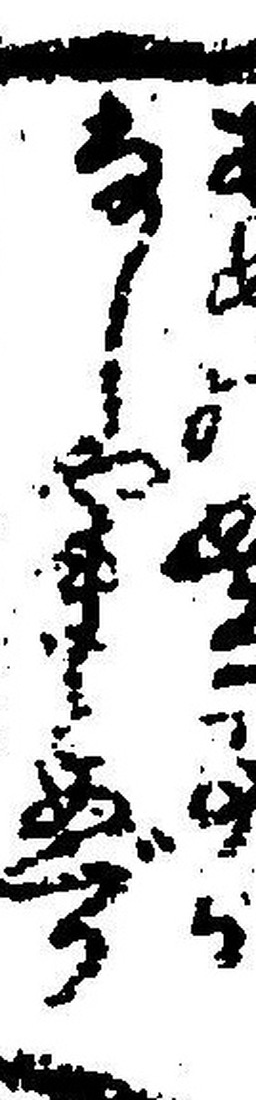なしやまとめぐり
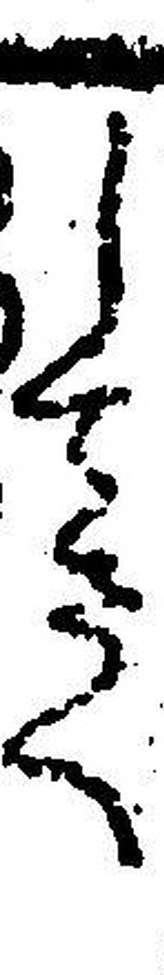してさへ
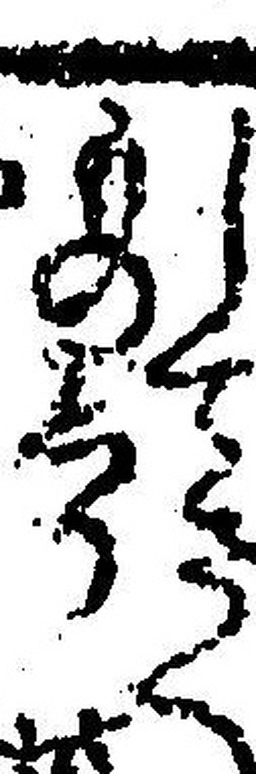ものしり
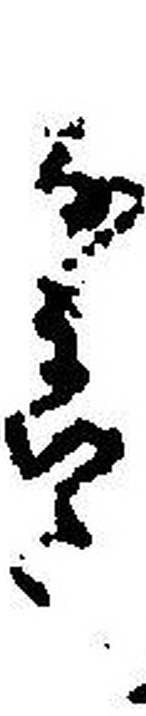なまいた
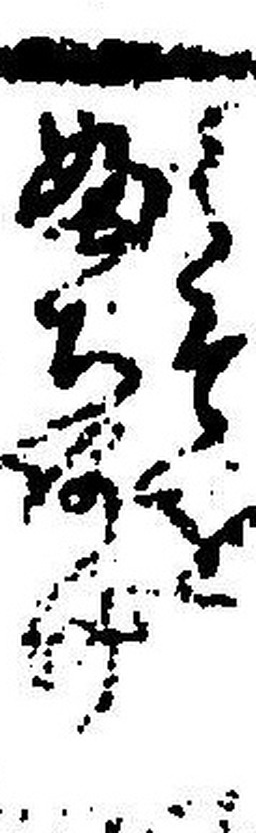ふちあけ
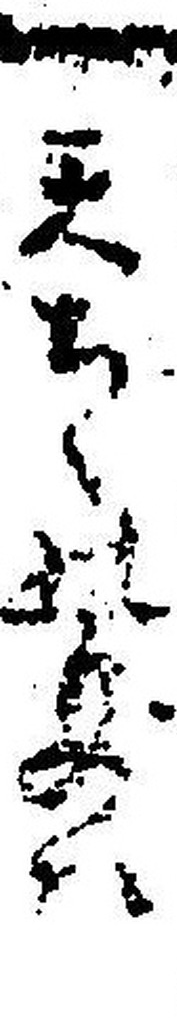天ちくのものは
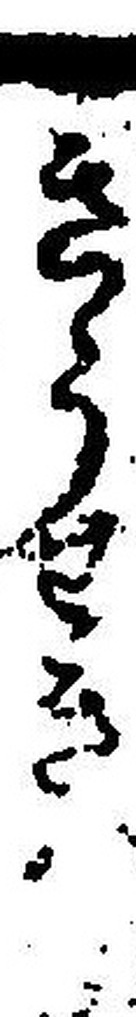きうせきは
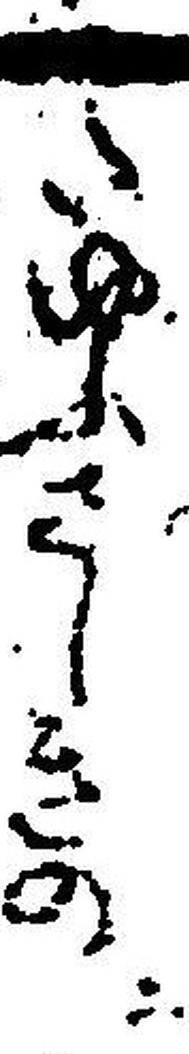たゆふさしきの
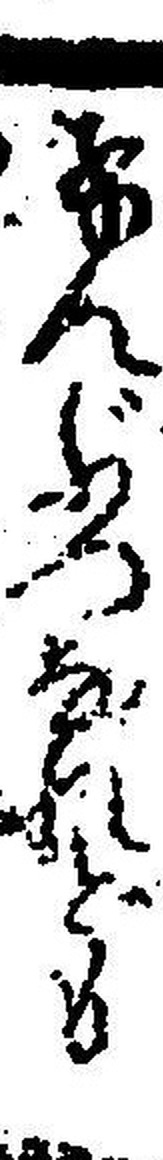けんぶつなれども
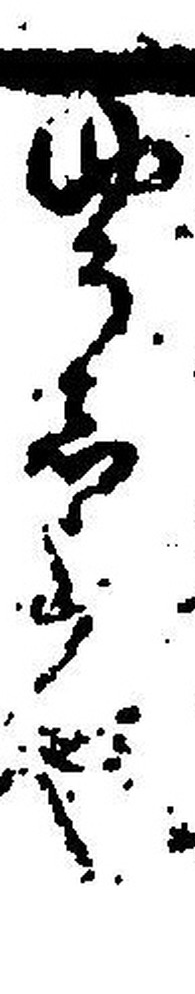ゆうしよや
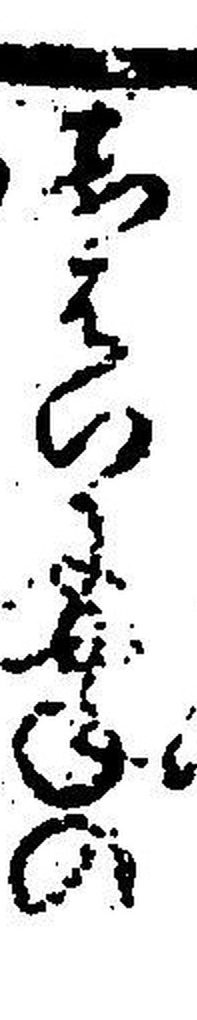しはいにやねの
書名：天竺儲之筋 / 市場通笑作
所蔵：東京大学総合図書館 General Library in the University of Tokyo, JAPAN
